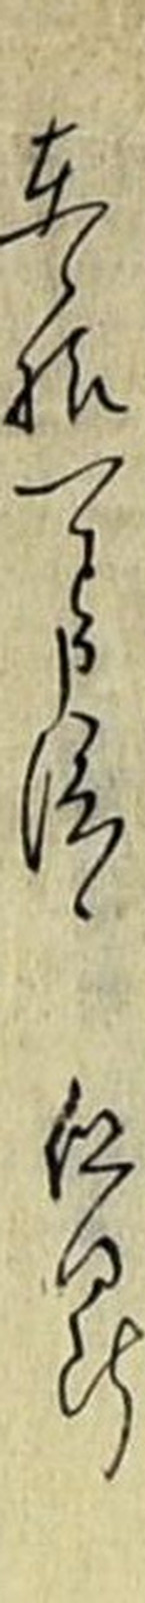在候様可被申渡候但同断
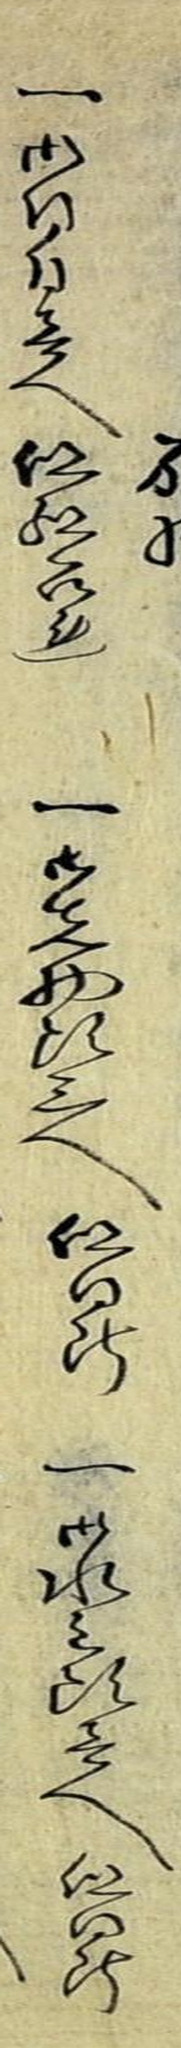一御目付壱人但組召連一御先物頭三人但同断一御水主頭壱人但同断
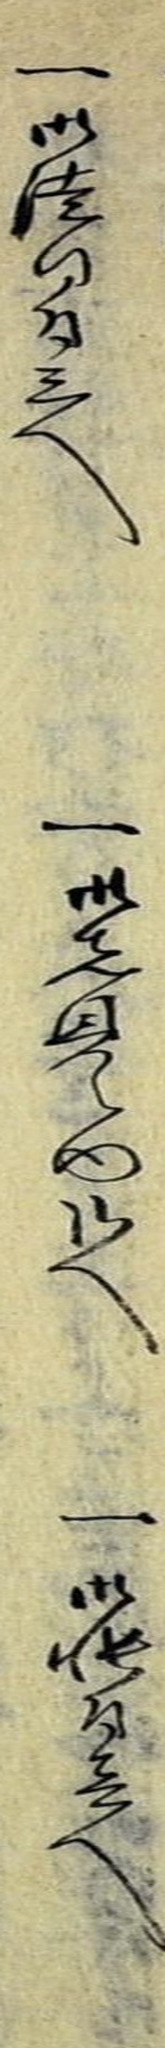一御徒目付三人一御先見之内弐人一御帳付壱人
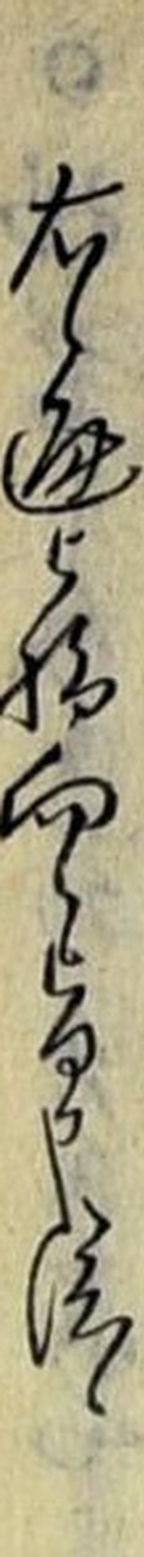右之通被指向候旨申渡候
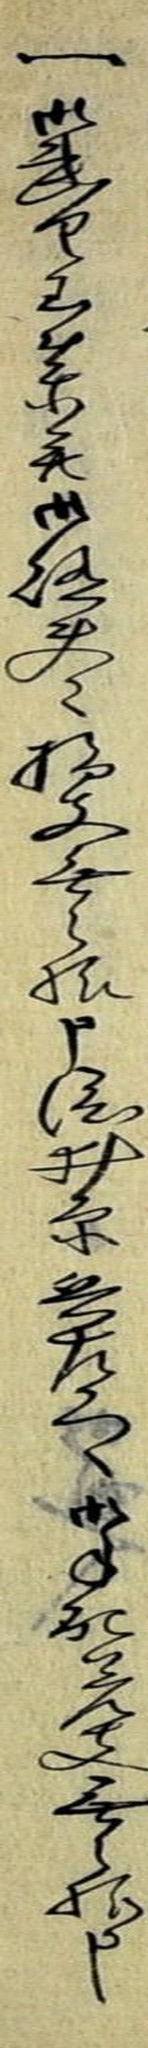一御武具玉薬并御賄夫々指支無之様申渡井原兵左衛門へ御手配差支無之様申
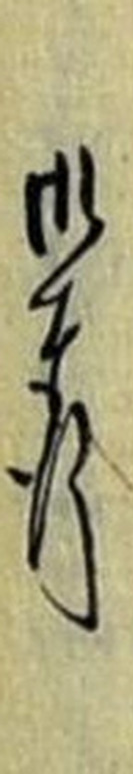御奉行
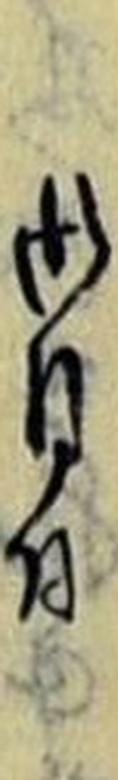御目付
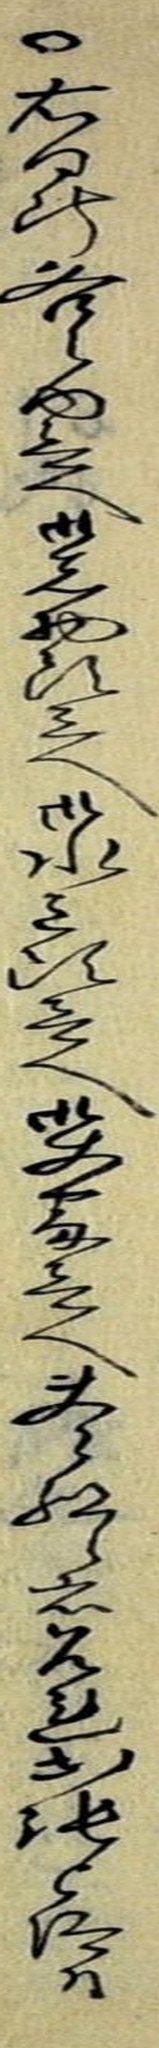〇右同断各之内壱人御先物頭三人御水主頭壱人御使番壱人夫々組之者召連出張被仰付
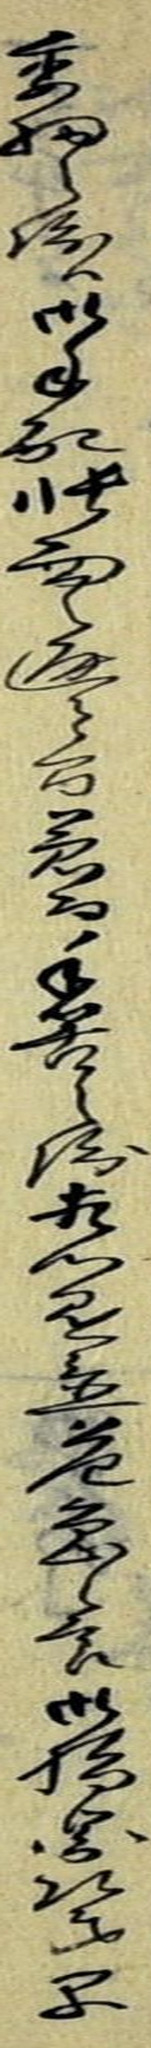委細之儀ハ御手配帳面之通ニ候間兼而手筈之儀相心懸置危急之節御指図次第早
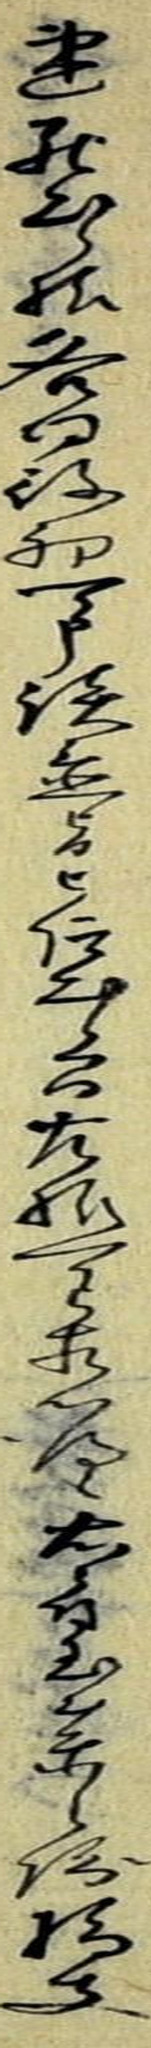速罷出候様各同役初可申談置旨被仰出候間左様可被相心得候右ニ付玉薬之儀指支
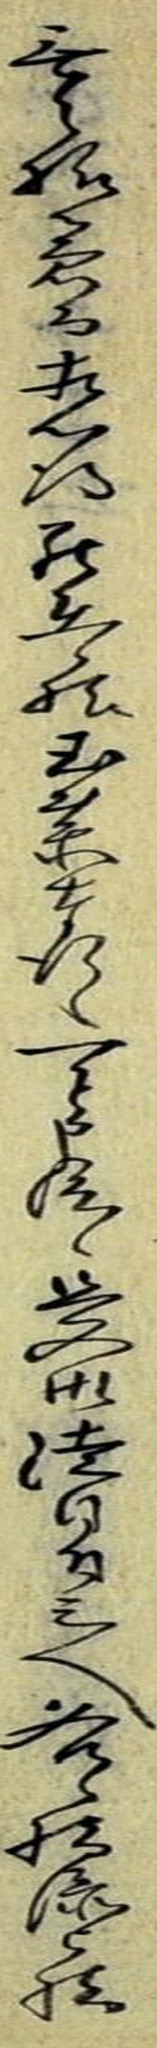無之様兼而相心得罷在候様玉薬奉行へ可被申渡候且又御徒目付三人各へ指添被指
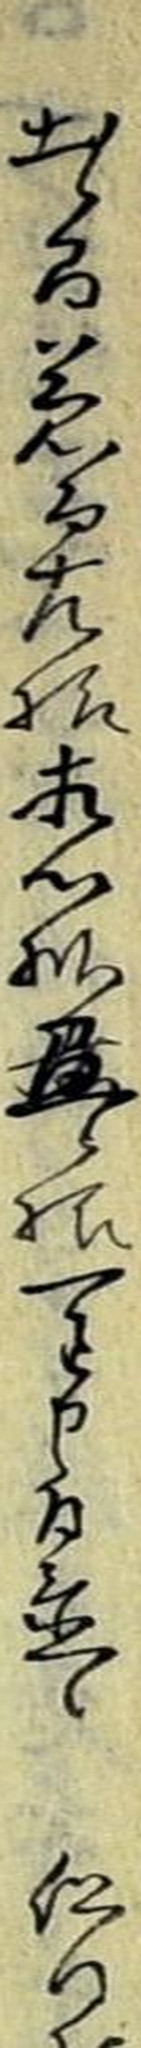出候間兼而左様相心得置候様可被申付置候但同断
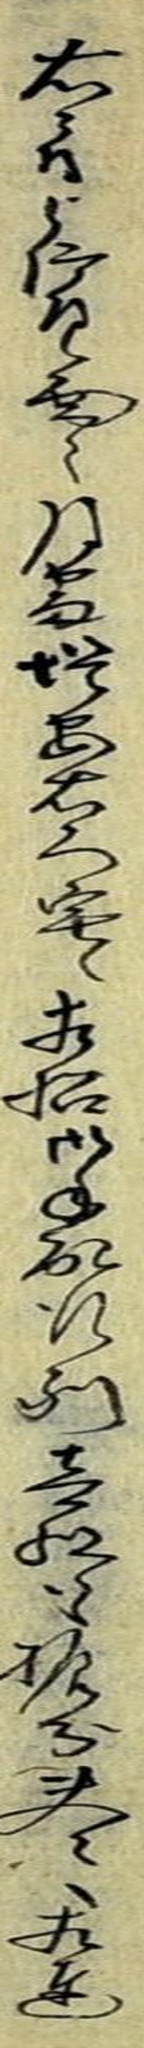右ニ付被仰付候面々月番堤安右衛門宅へ相招御手配行列壱組ツヽ振分夫々へ相達
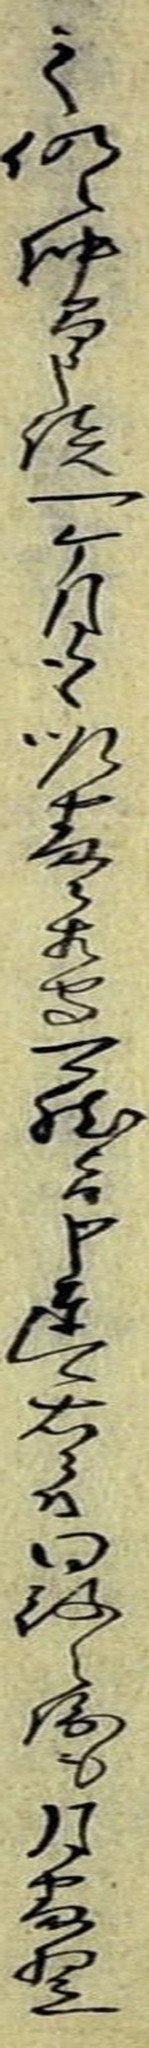之仍之仲間申談一ケ月ツヽ順番ニ相守可然旨申達候右ニ付同役之儀も月番翌
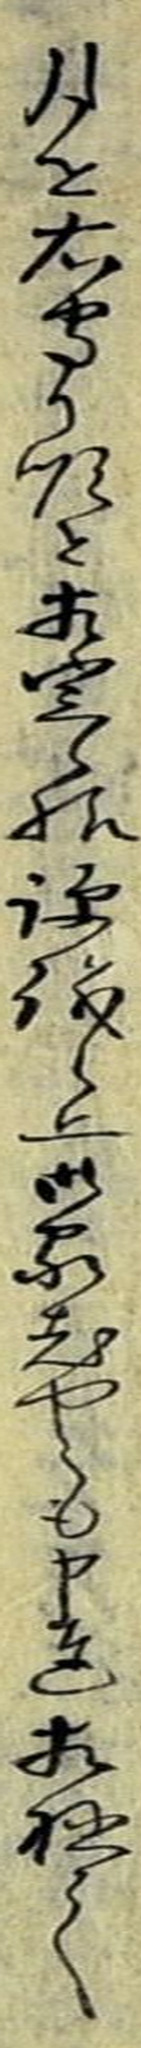月を右守り順と相定候様評議之上御家老中へも申達相極之
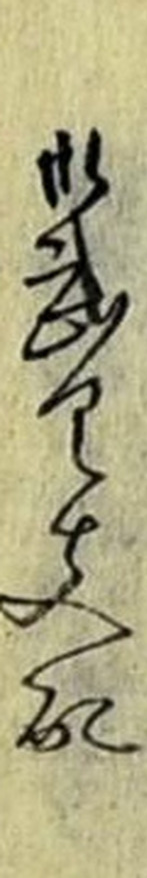御武具支配
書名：命令之部 三
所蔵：福井県文書館 Fukui Prefectural Archives
